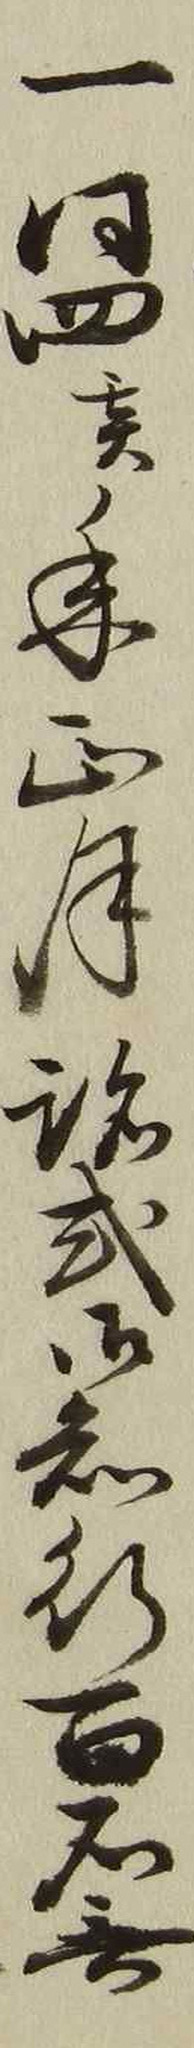一同四亥年正月跡式御知行百石無
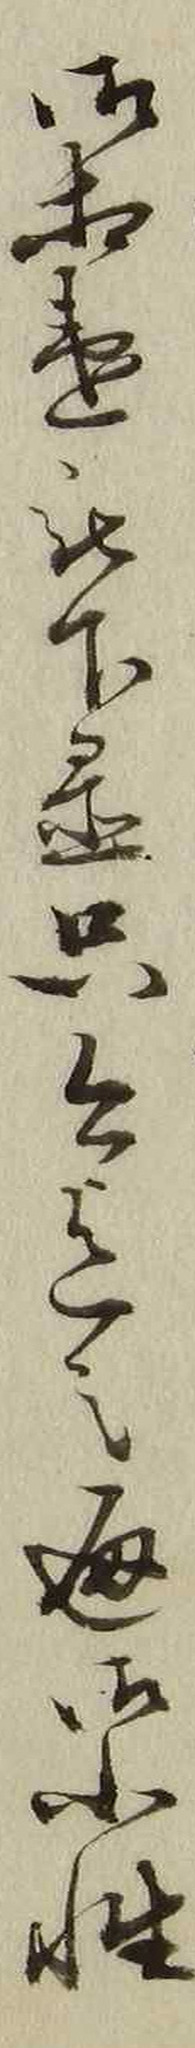御相違被下置只今迄之通御小性
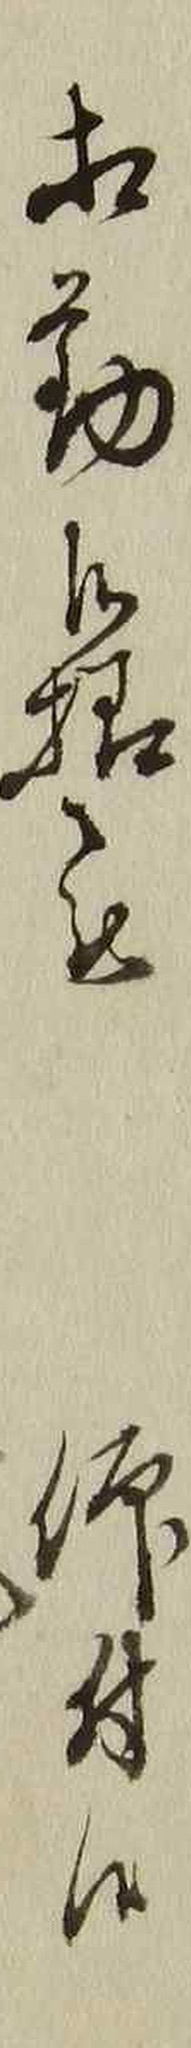相勤候様被仰付候
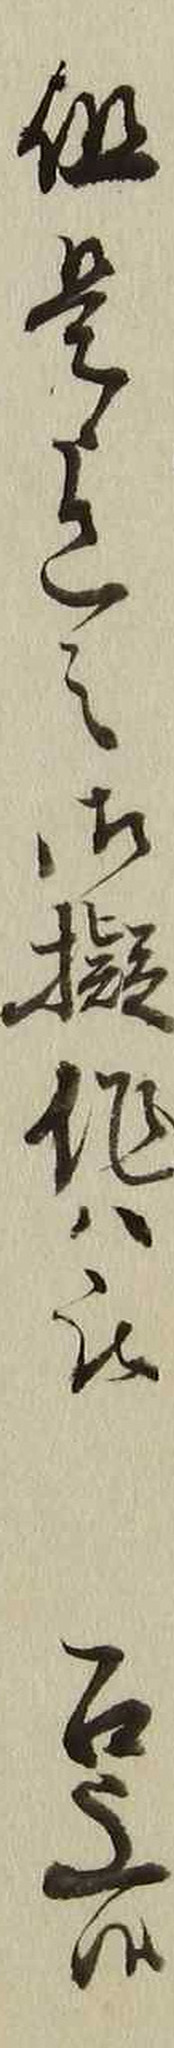但是迄之御擬作ハ被召上候
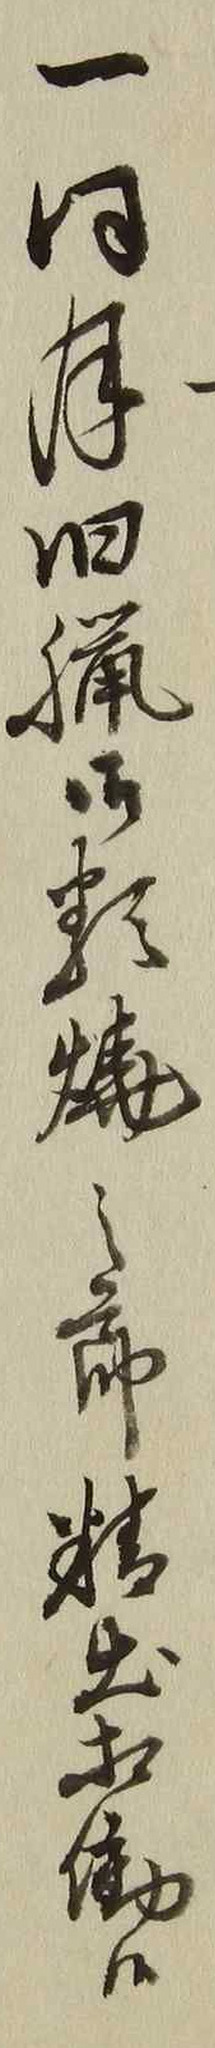一同月旧猟御類焼之節精出相働候
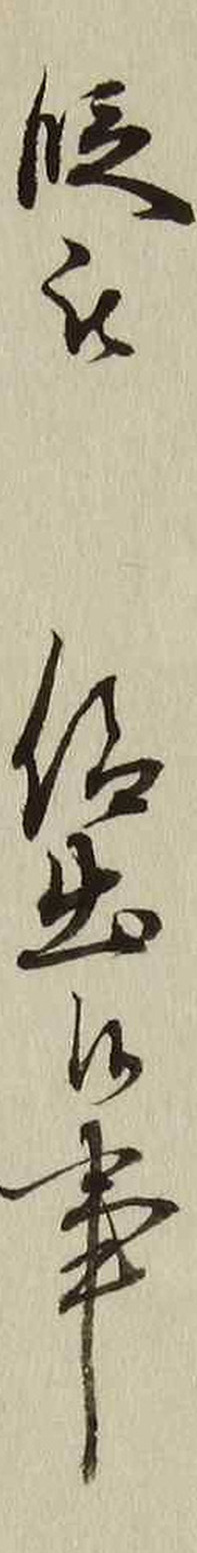段被仰出候事
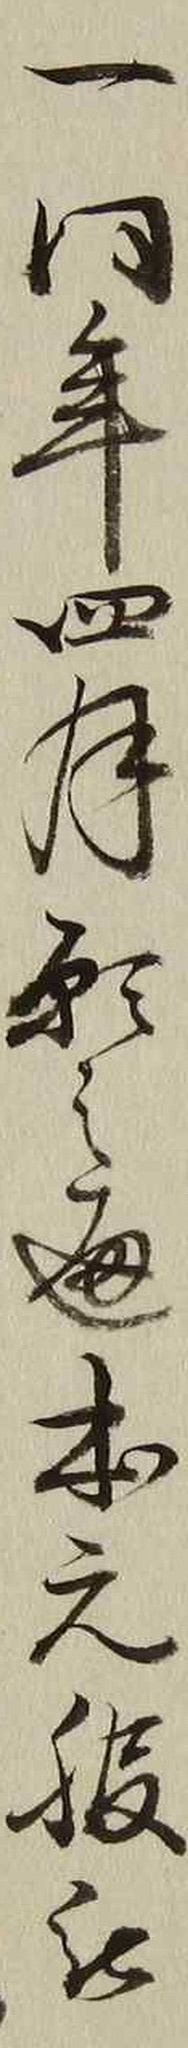一同年四月願之通本元服被
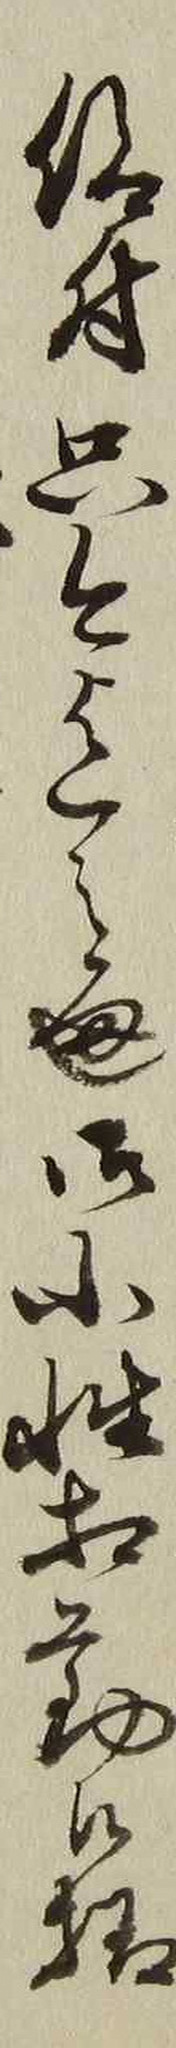仰付只今迄之通御小性相勤候様
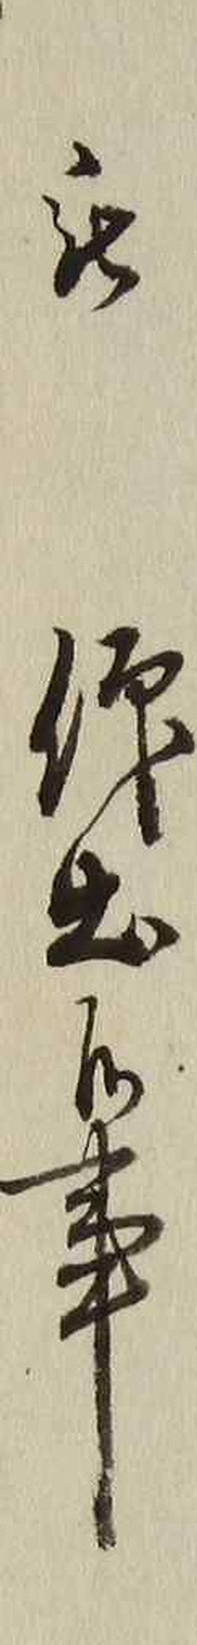被仰出候事
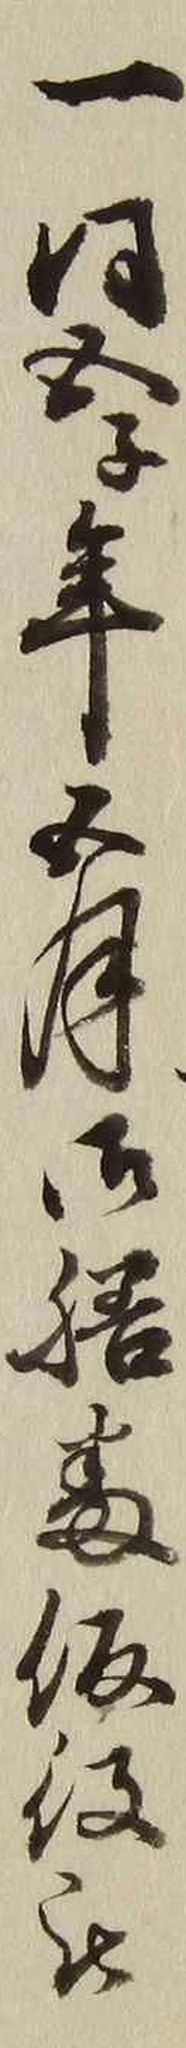一同五子年五月御膳番仮役被
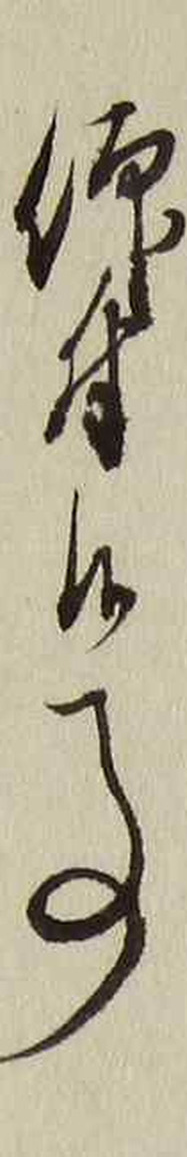仰付候事
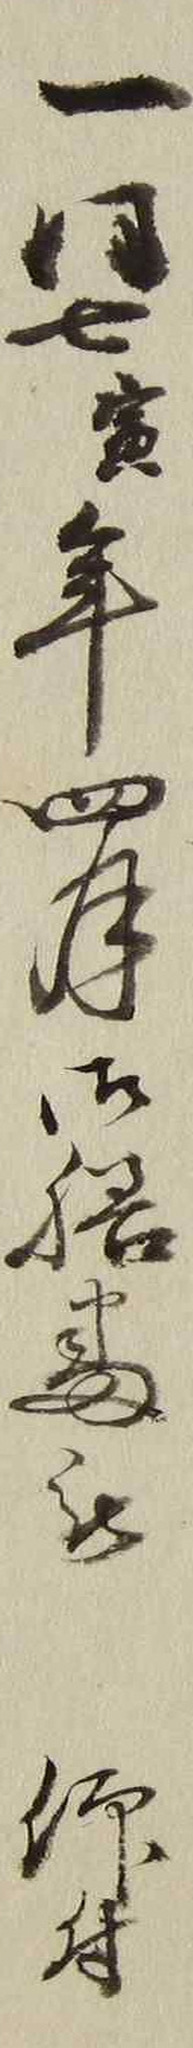一同七寅年四月御膳番被仰付
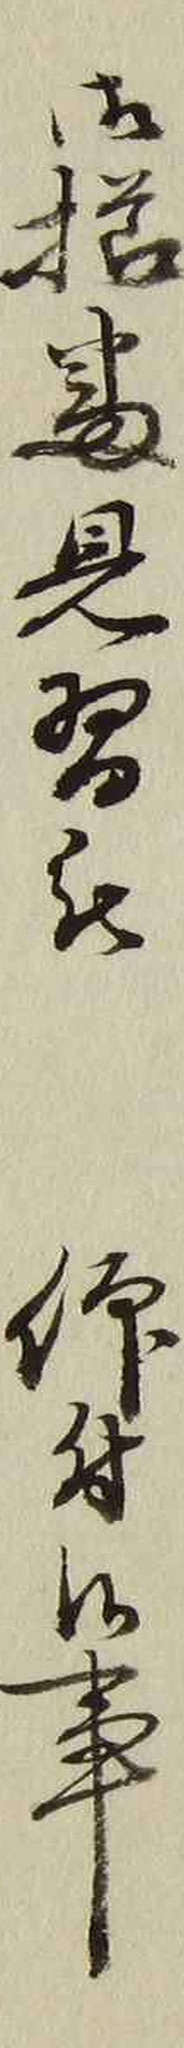御膳番見習被仰付候事
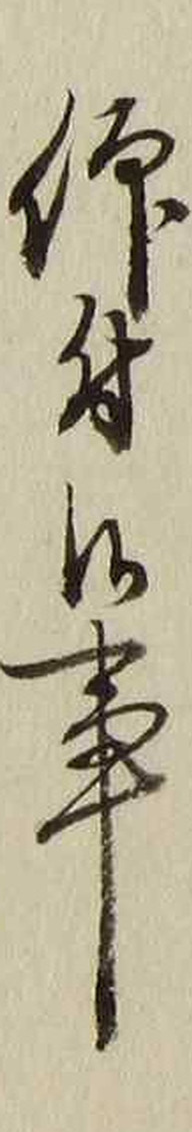仰付候事
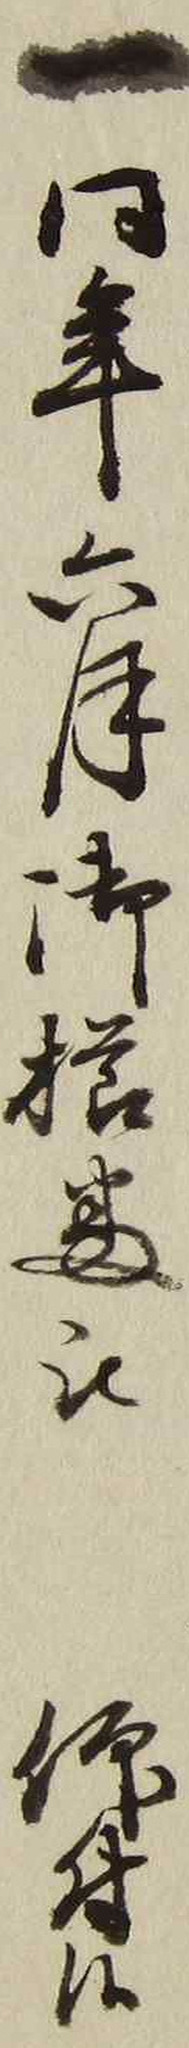一同年六月御櫛番被仰付候
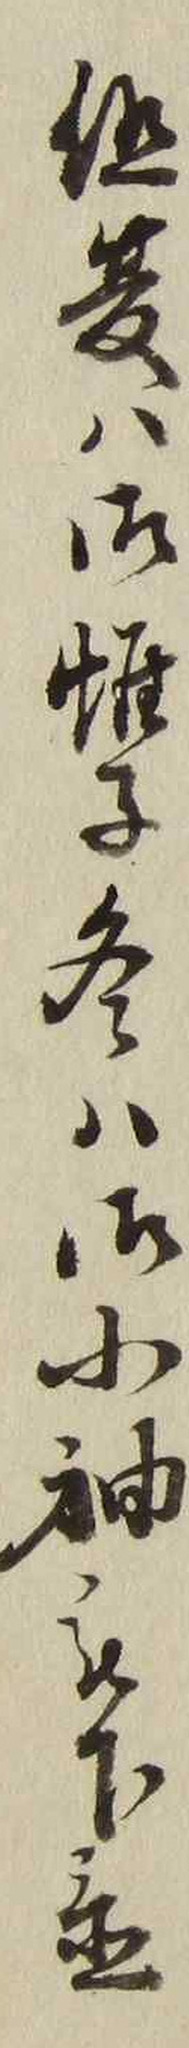但夏ハ御帷子冬ハ御小袖被下置
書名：諸士系譜　巻之35　は之部3
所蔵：会津若松市立会津図書館
